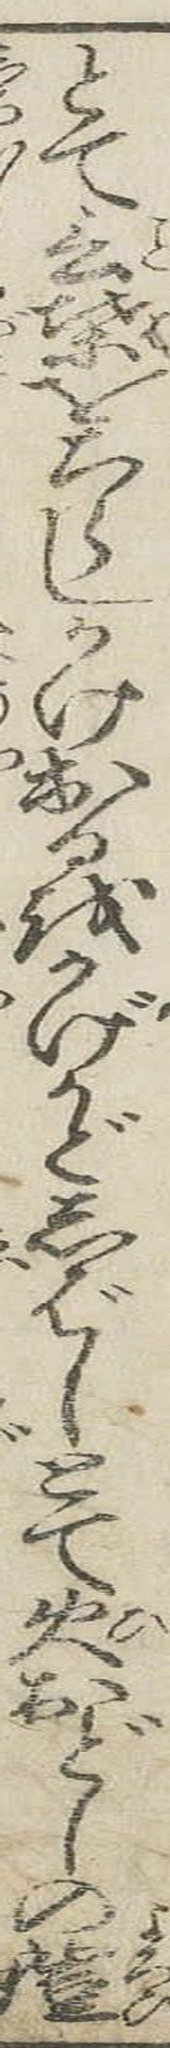とて言葉をちらしかけ出るをかげかどしばしとて火おどしの鎧
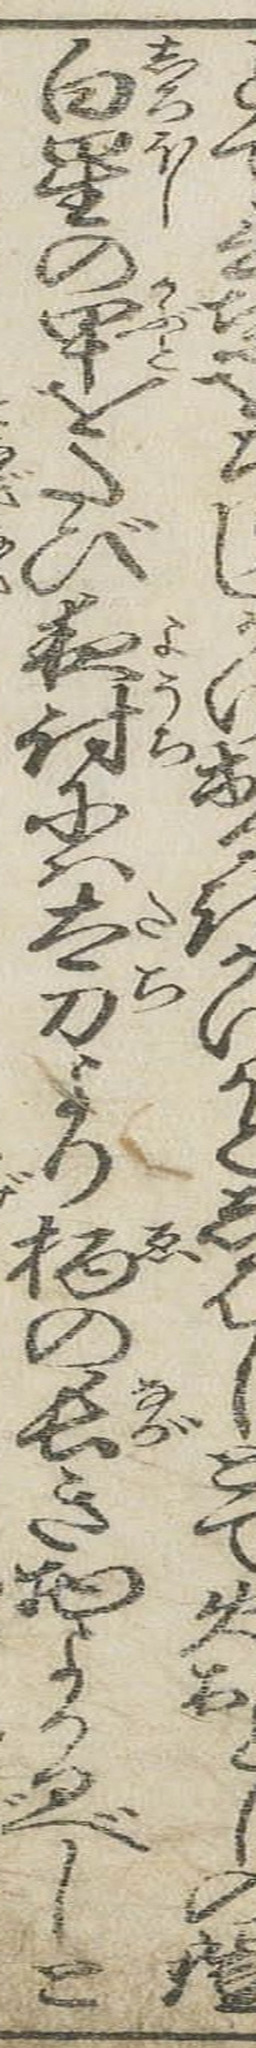白星の甲をたび夜討には太刀より柄の長き物よかるべしと
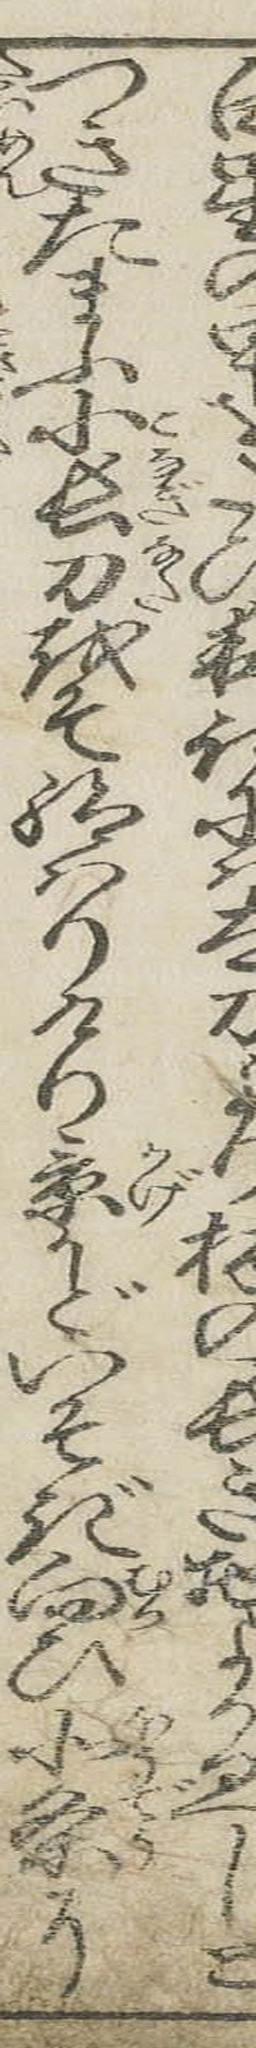つきたまふ小長刀をそ給はりけり景かどいそぎ向ひ北条に
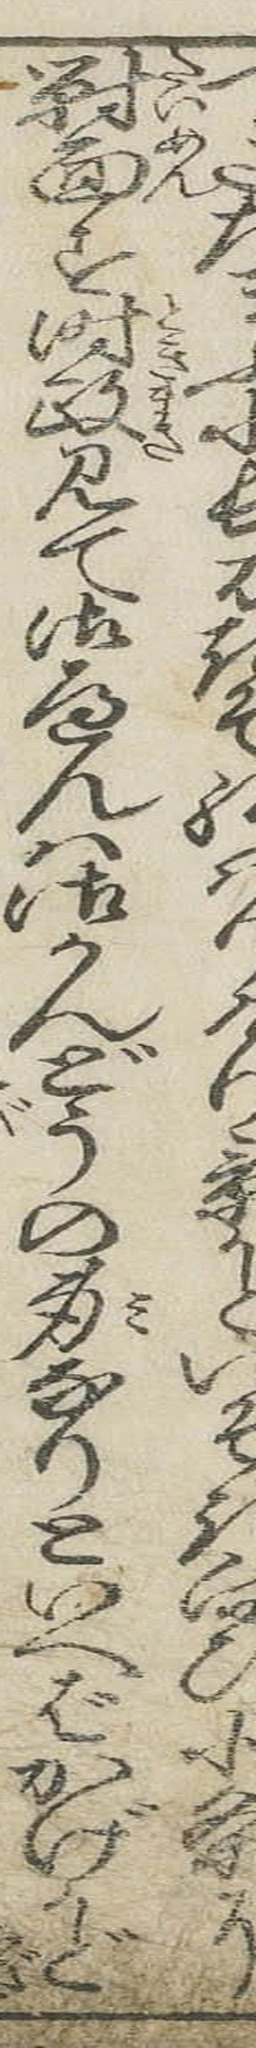対面す時政見て御へんは御かんどうの身なりといへばかげかど
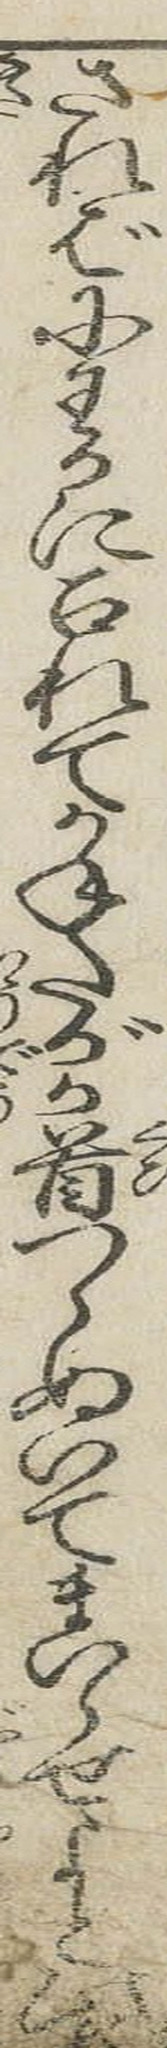さればにわかに召れてかねたがか首つらぬいてまいらせよと此長
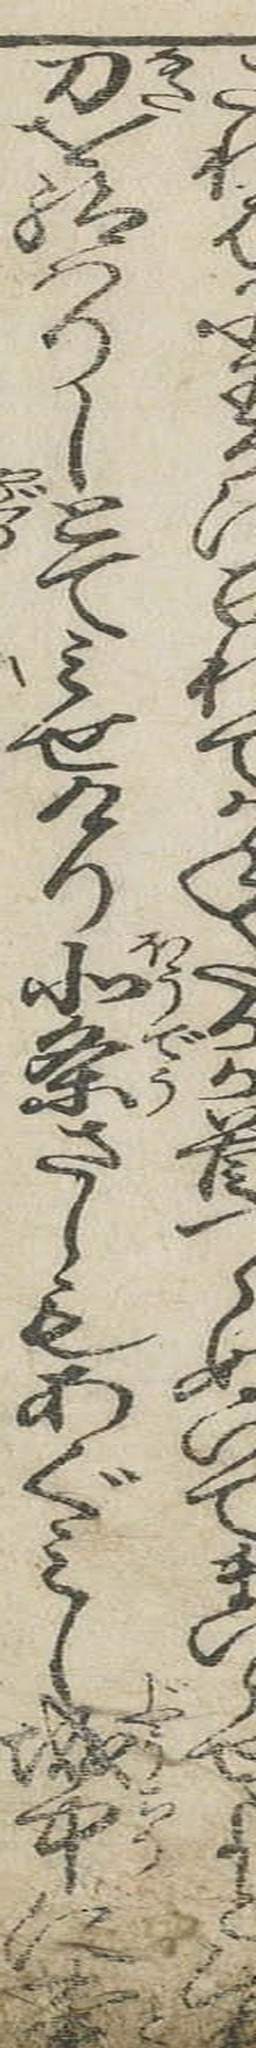刀を給はりしとてみせけり北条さしもあぐみし城中に事
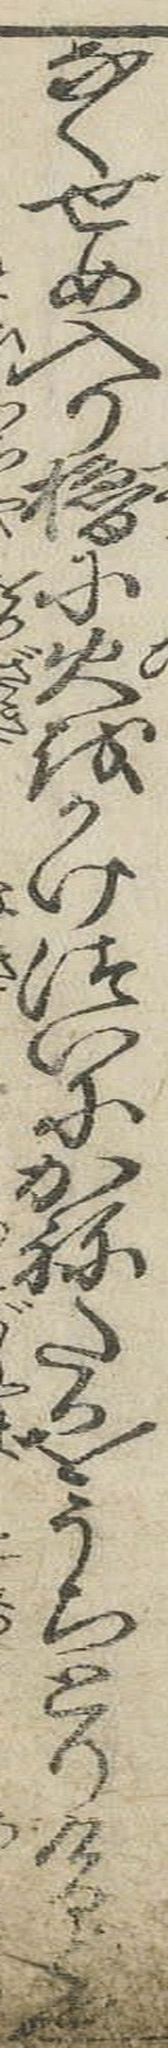なくせめ入り櫓に火をかけついにかねたかをうちとりけると也
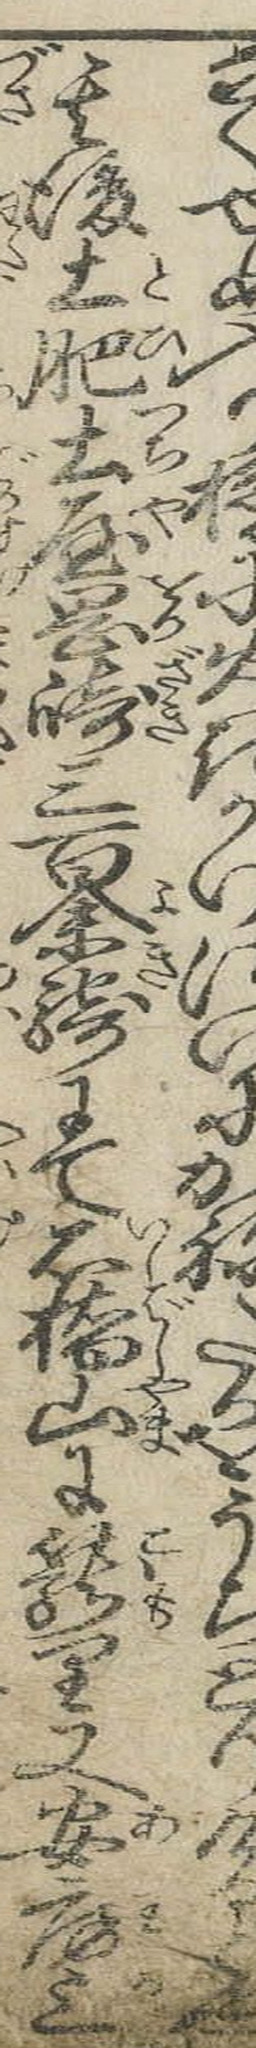其後土肥土屋岡崎三百余騎にて石橋山に籠り又安房上
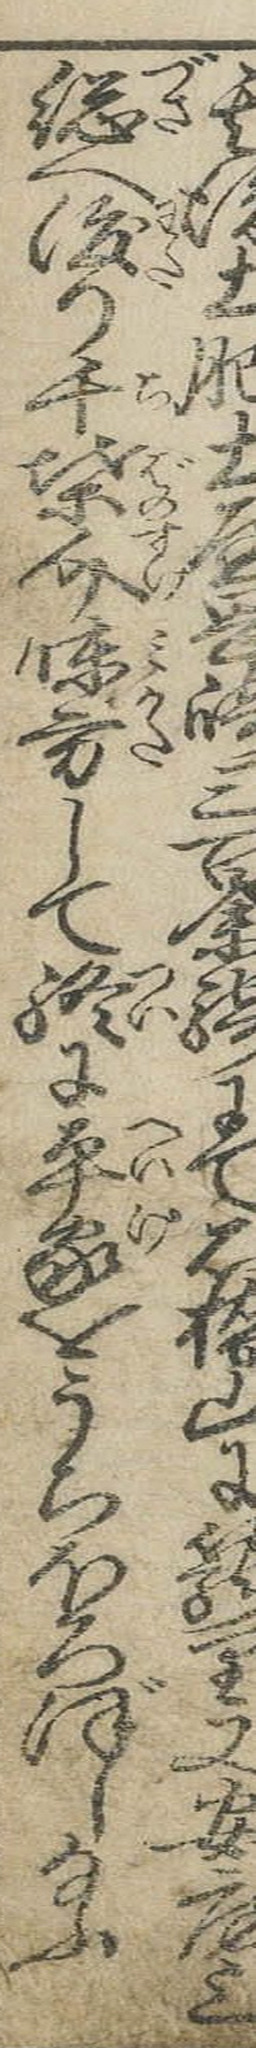総へ渡り千葉介味方して終に平家をうちほろぼし給ふ

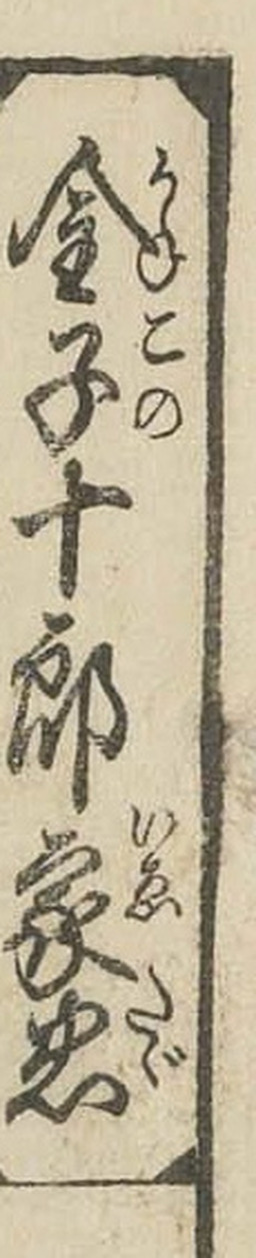金子十郎家忠
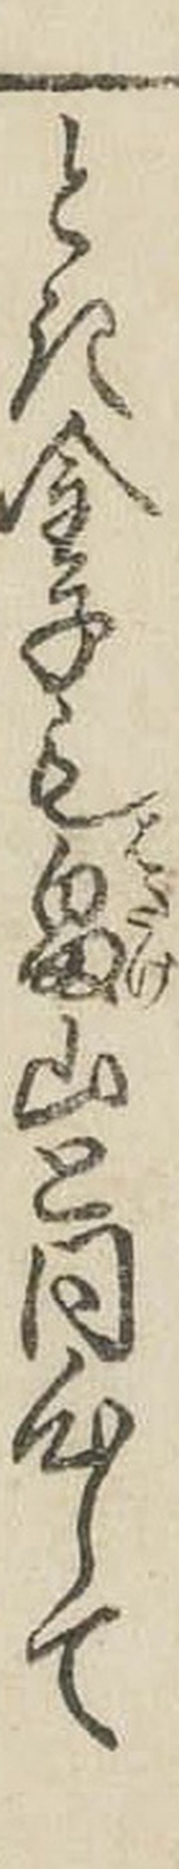とき金子も畠山と同心して
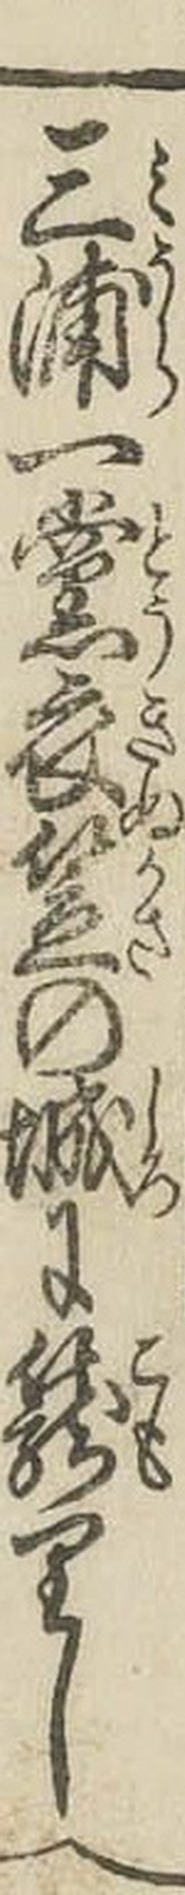三浦一党衣笠の城に籠りし
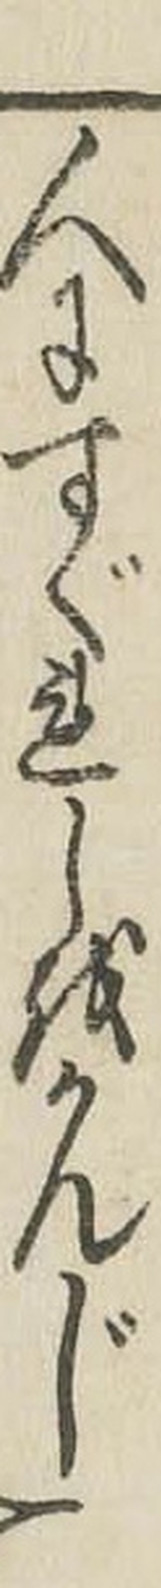人にすぐれしをかんじ
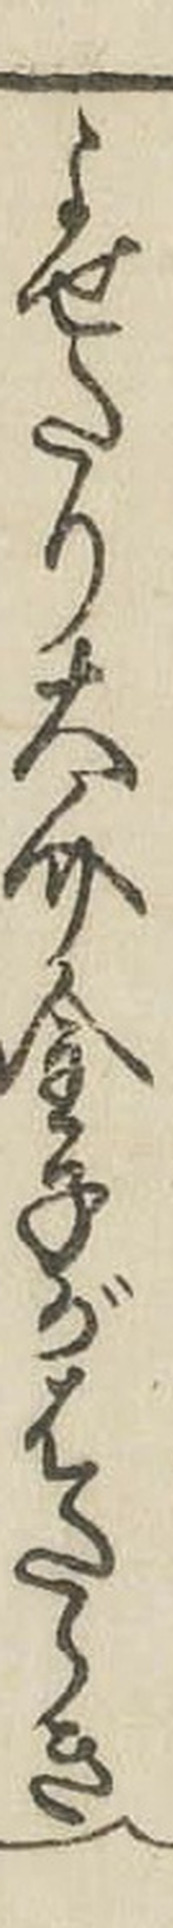よせたり大介金子がはたらき
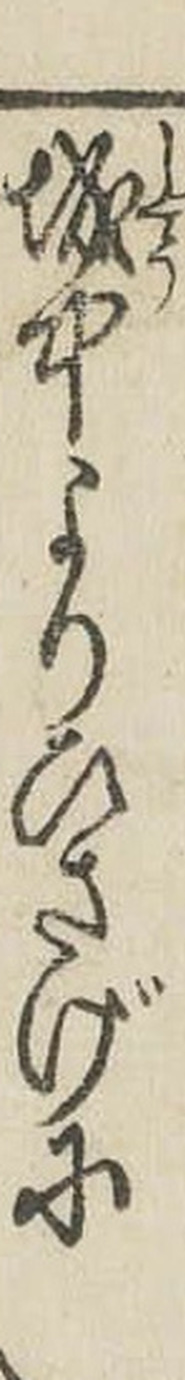城中よりひさげに
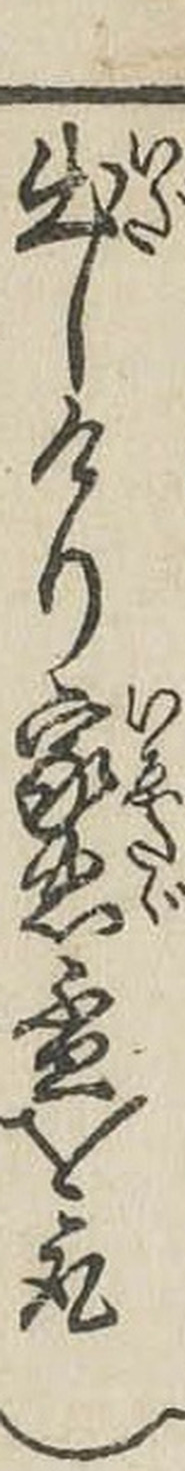出しけり家忠盃を取
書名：絵本写宝袋 9巻 3之巻
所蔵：東京学芸大学教育コンテンツアーカイブ
